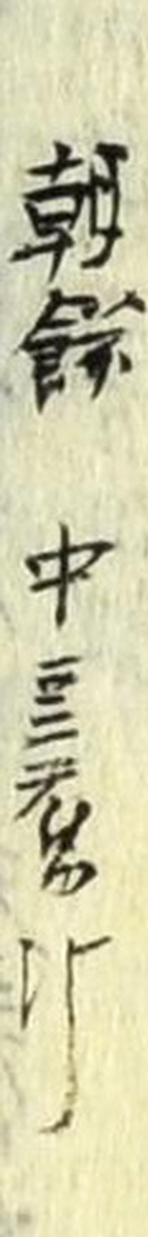朝餅中豆腐汁
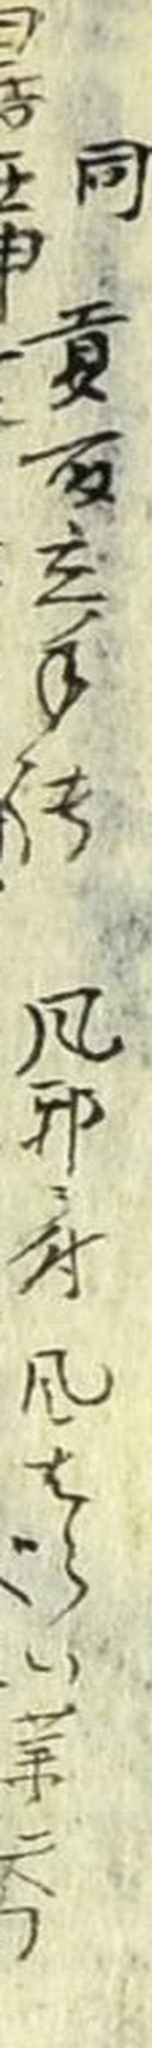同貢取立手伝風邪ニ付風はらい薬呑
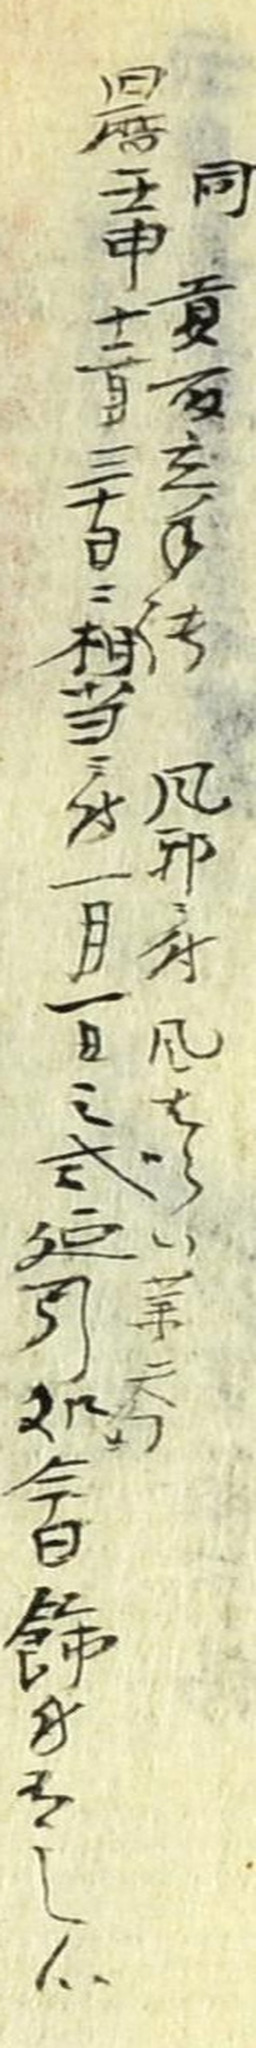旧暦壬申十二月三十日丹相当ニ付一月一日之式延引処今日飾付有之候
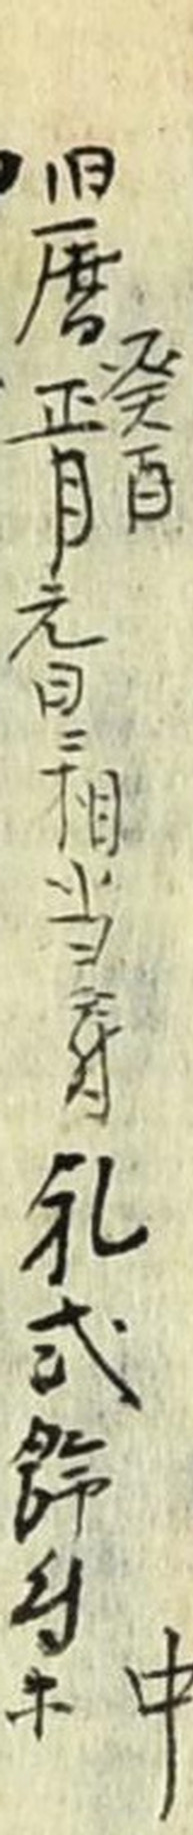旧暦正月元日ニ相当ニ付礼式飾付等
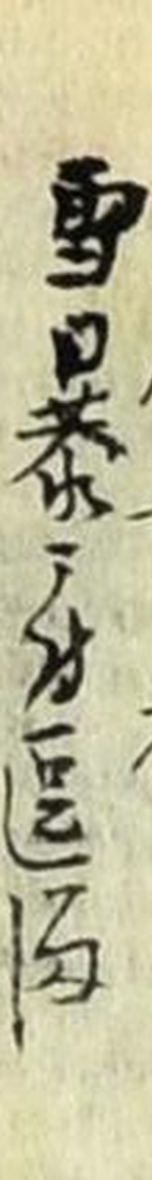雪暴ニ付逗溜
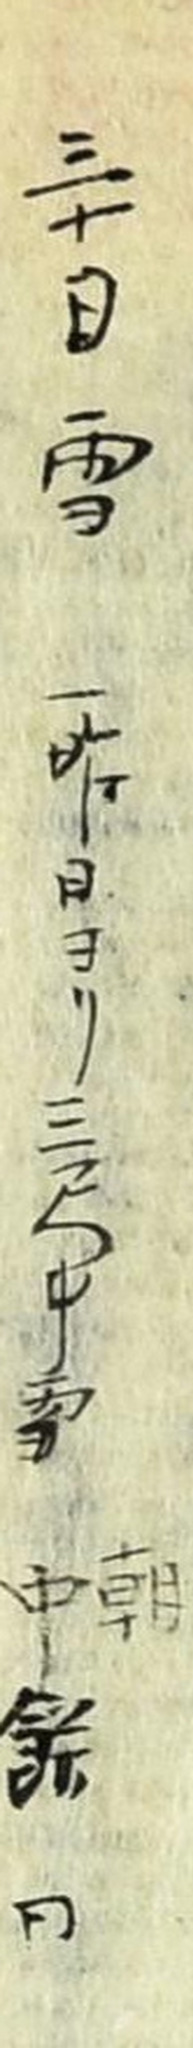三十日雪一昨日ヨリ三尺計雪中餅同
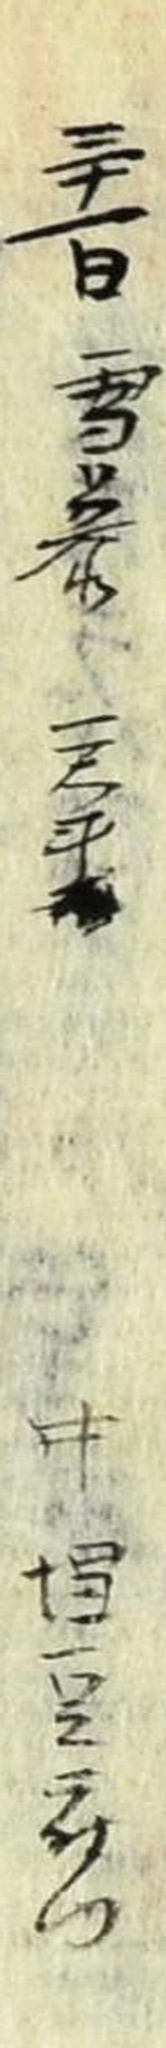三十一日雪暴一尺計中埋豆腐

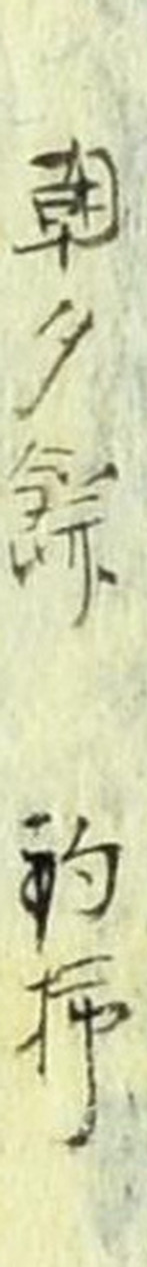朝夕餅釣柿
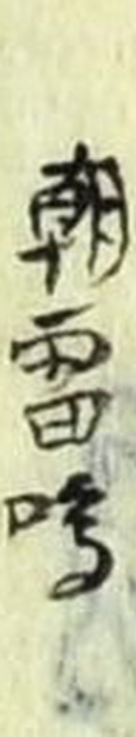朝雷鳴
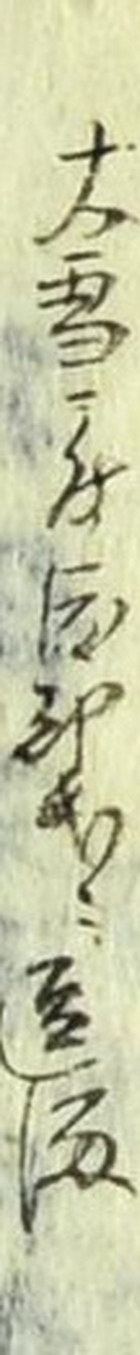大雪ニ付渡部氏に逗留
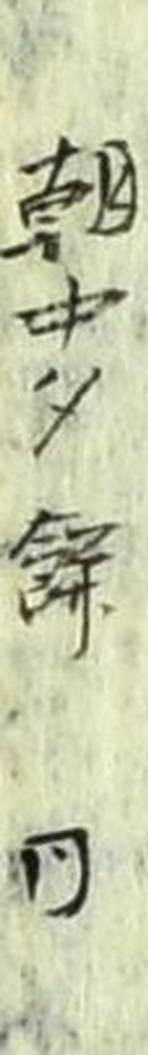朝中夕餅同
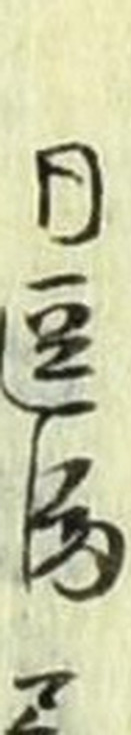同逗留
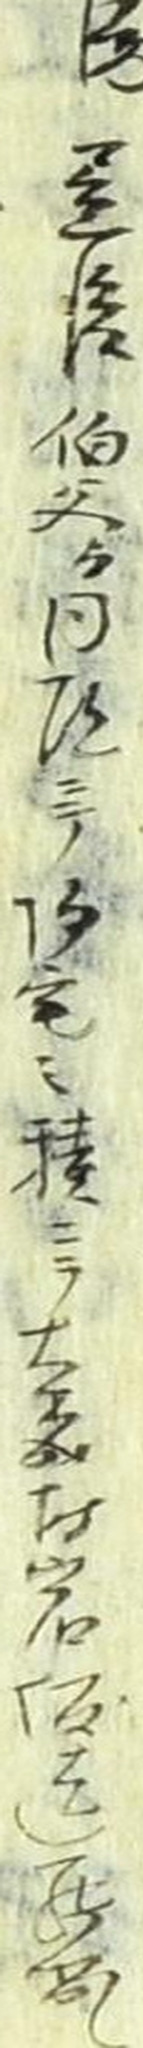同逗留昼後伯父与同道ニテ帰宅之積ニテ大森村岩坂迄罷出候
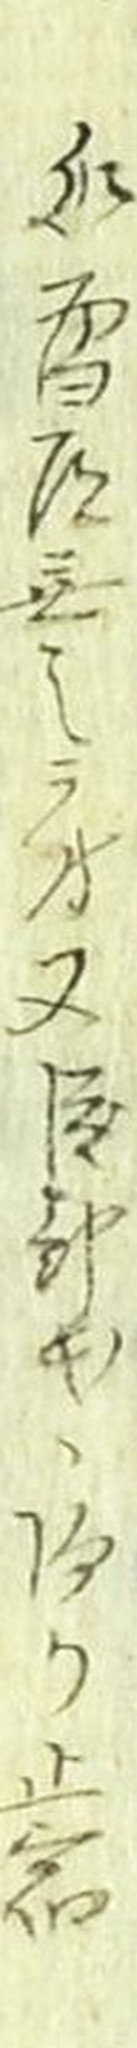処雪道無之ニ付又渡部氏へ帰り止宿
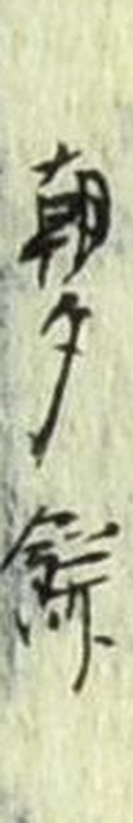朝夕餅
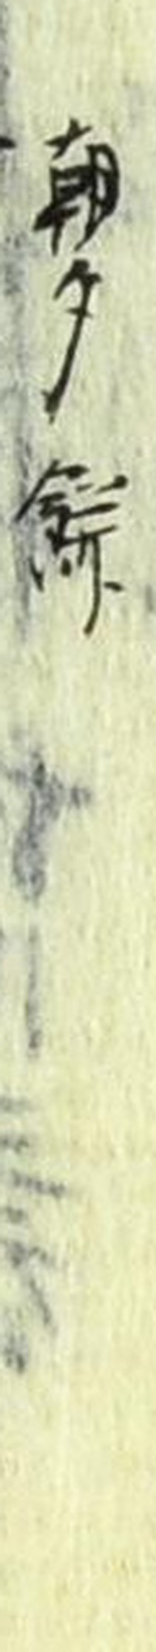朝夕餅
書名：（日記）
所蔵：福井県文書館 Fukui Prefectural Archives
